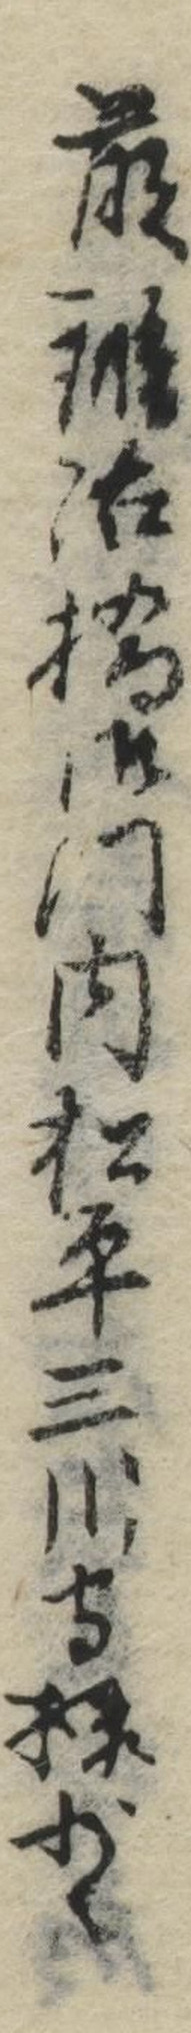崩鍛冶橋御門内松平三川守様少〻
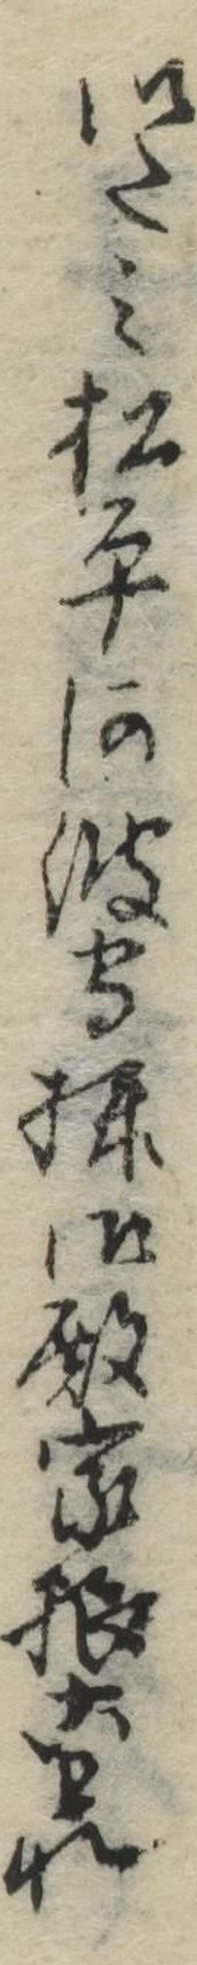いたみ松平阿波守様御殿家根こわれ

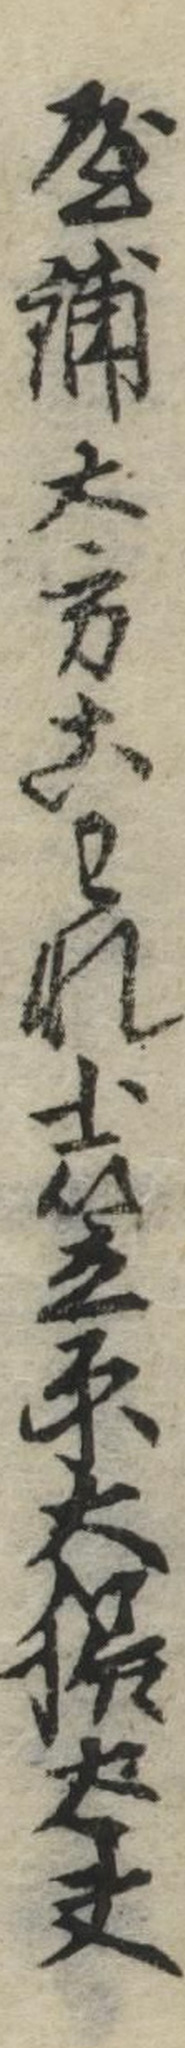屋鋪大方こわれ小笠原大膳太夫
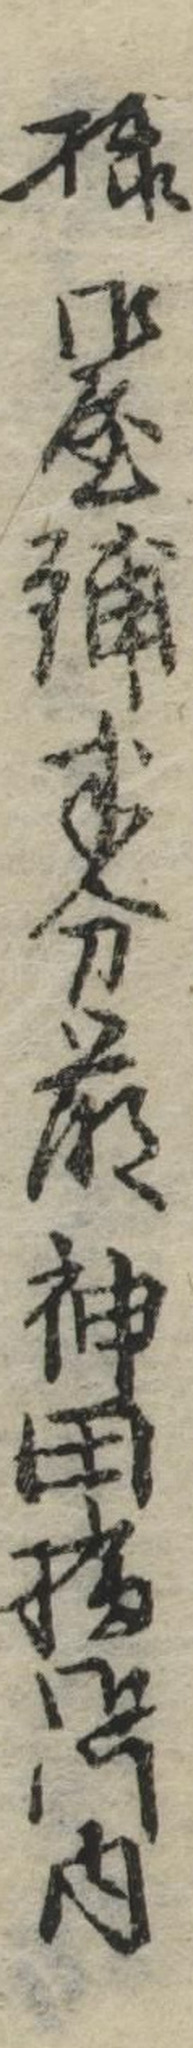様御屋鋪半分崩神田橋御門内
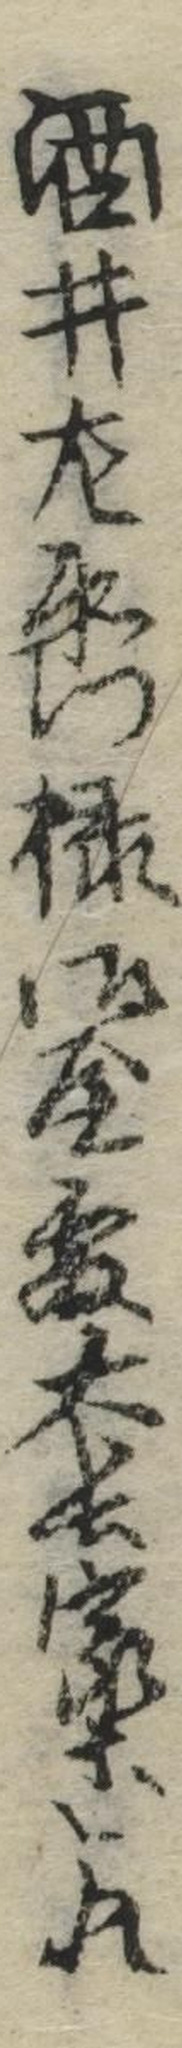酒井左衛門様御屋敷大長屋こわれ
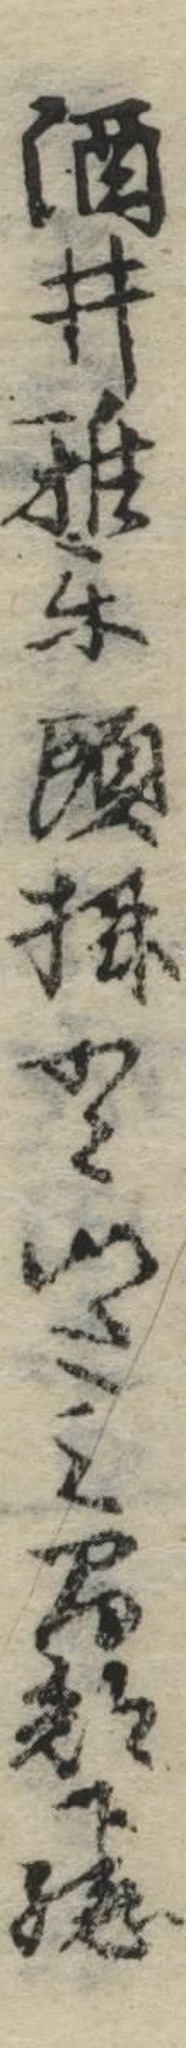酒井雅楽頭様少〻いたみ間部下総
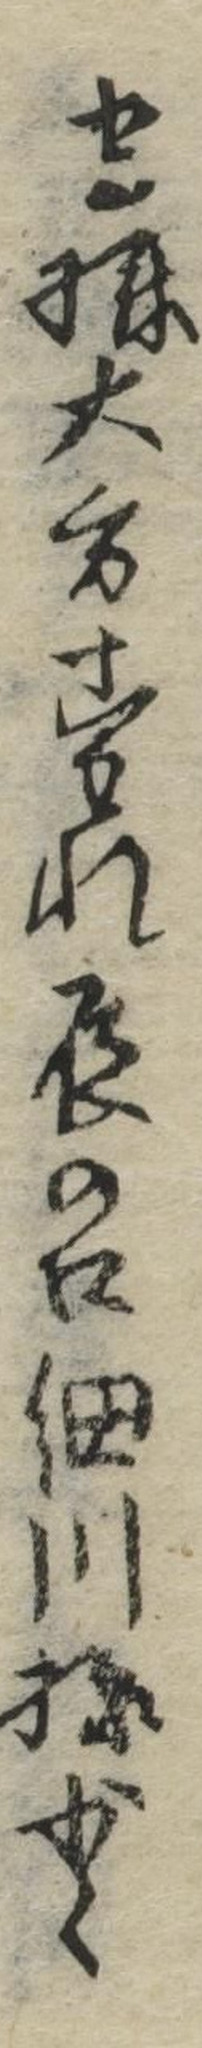守様大方こわれ辰の口細川様少〻
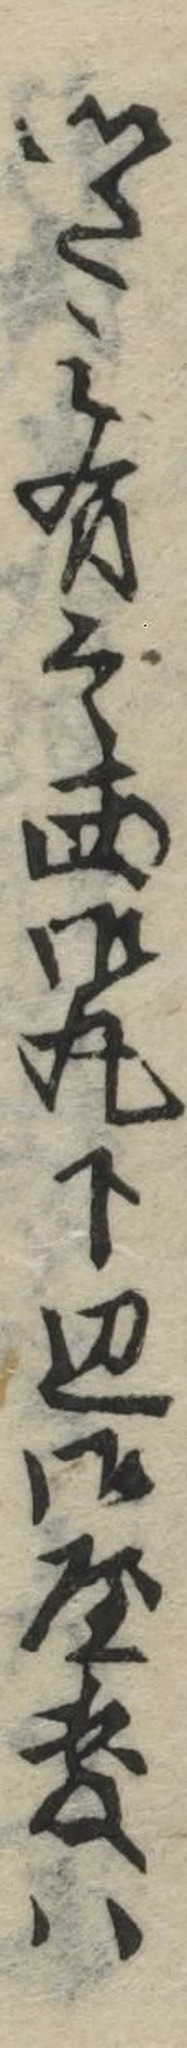いたみ之有西御丸下辺御屋敷は
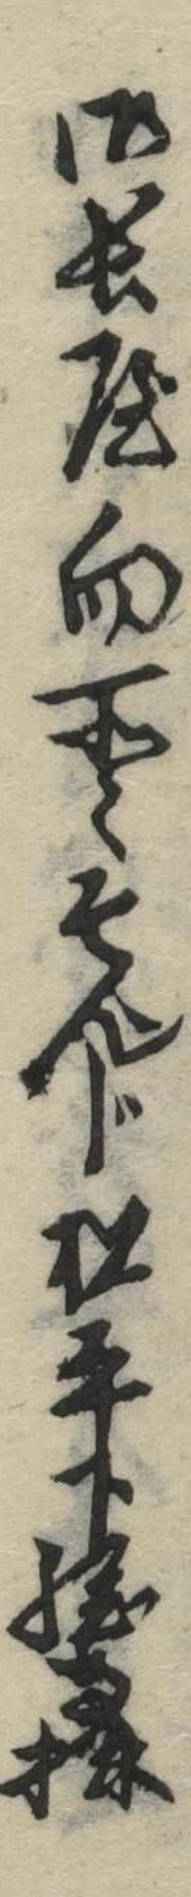御長屋向所〻そんじ松平下総守様
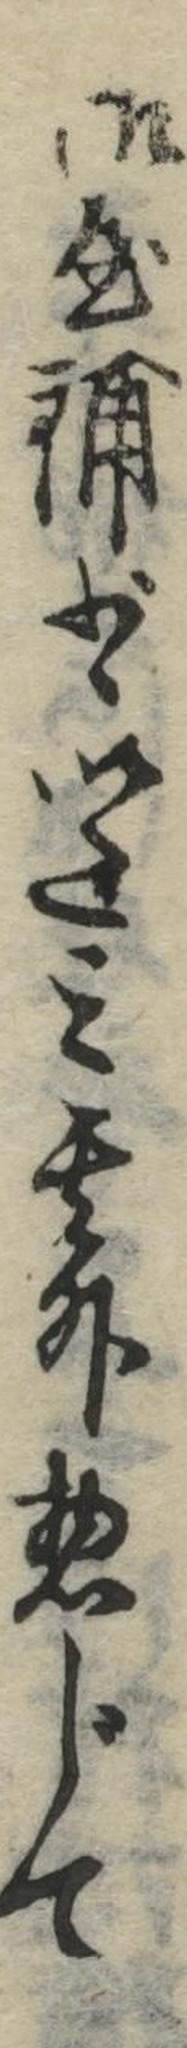御屋鋪少々いたみ其外惣じて
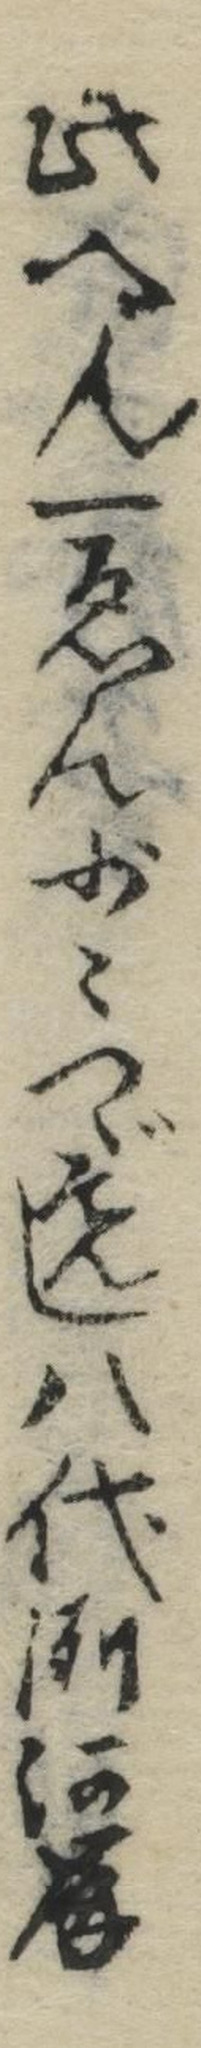此へん一ゑん少々つゞそんし八代洲河岸
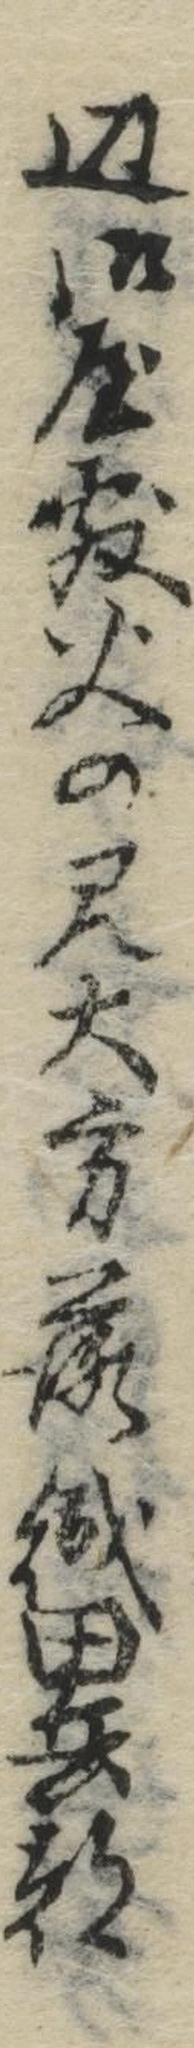辺御屋敷火の見大方落織田兵部
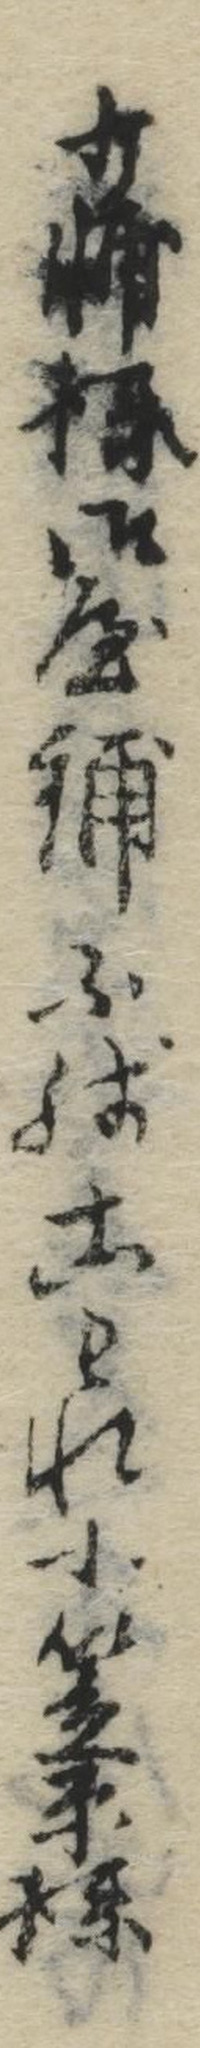少輔様御屋鋪不残こわれ小笠原様
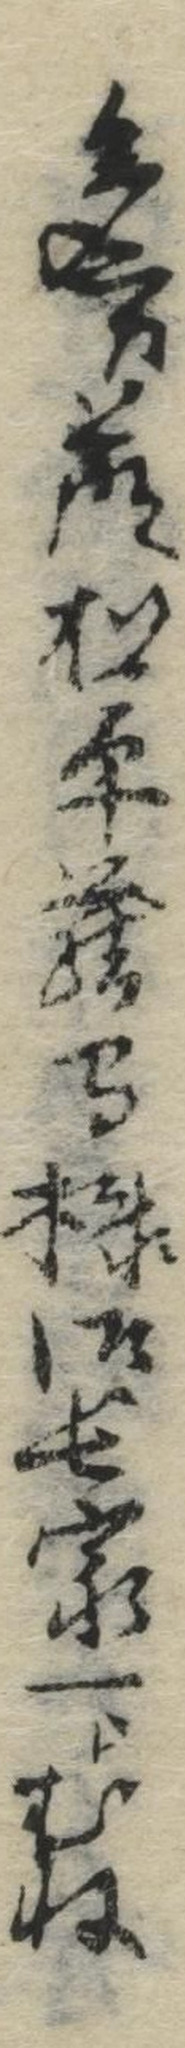多方崩松平蔵守様御長家一むね
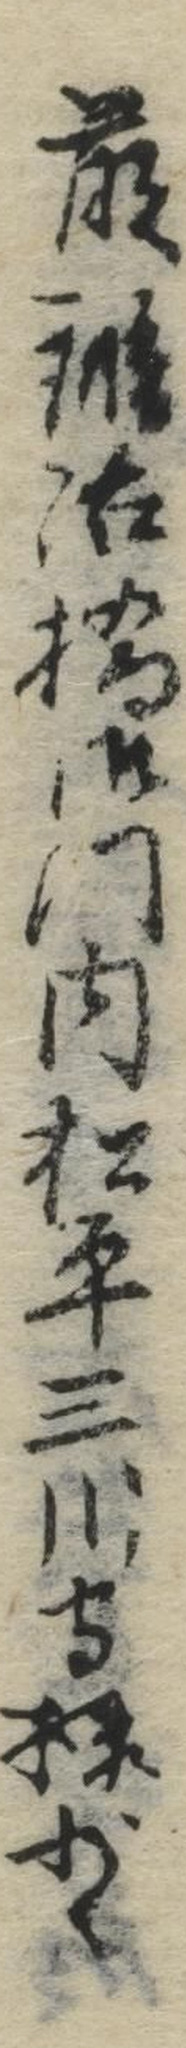崩鍛冶橋御門内松平三川守様少々
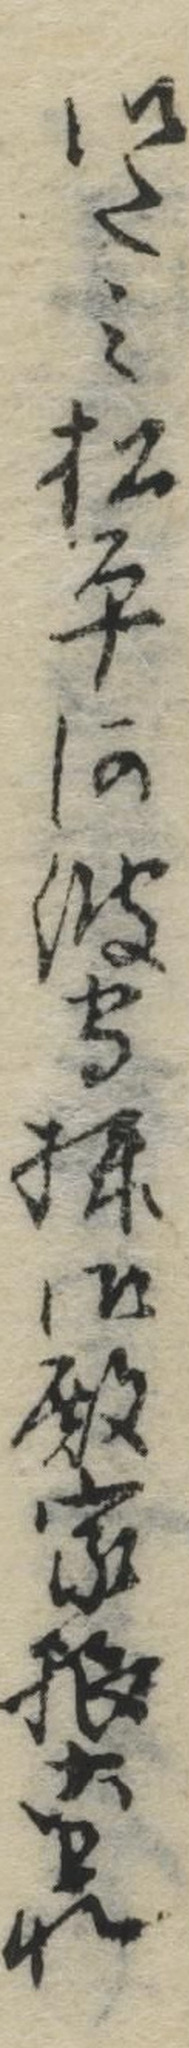いたみ松平阿波守様御殿家根こわれ
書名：安政三年辰八月廿五日夜　大江都御屋敷方寺社市中共　大嵐水入場所明細書之寫　并街道筋近郷聞書
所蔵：東京大学地震研究所図書室 Earthquake Research Institute Library, The University of Tokyo, JAPAN
